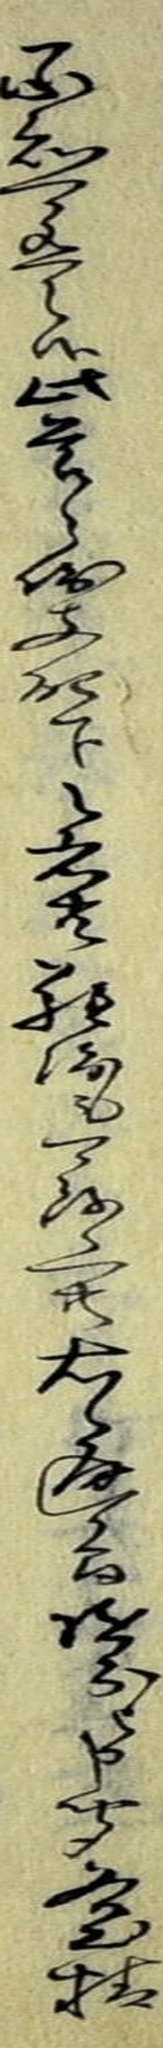承知可有之候此節之儀支配下之者共難儀も可致候へ共右之通候間随分被申聞各出精
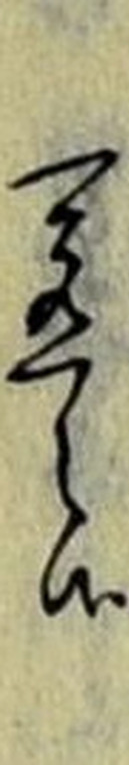可有之候
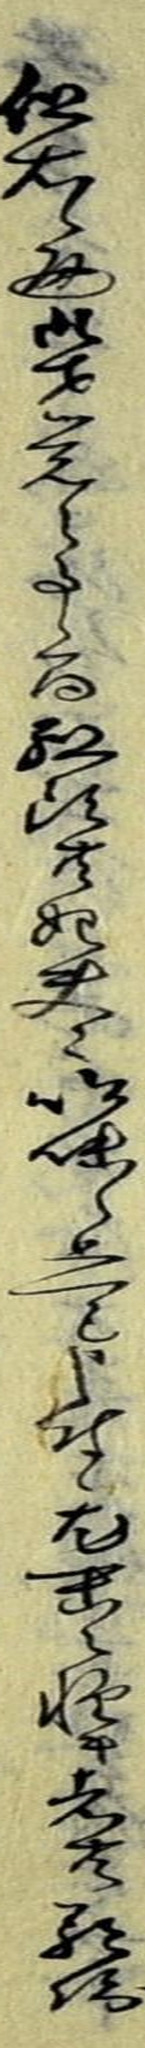但右之通御才覚之事候間組頭共始夫々吟味之上可被申付候尤末々軽き者共難儀
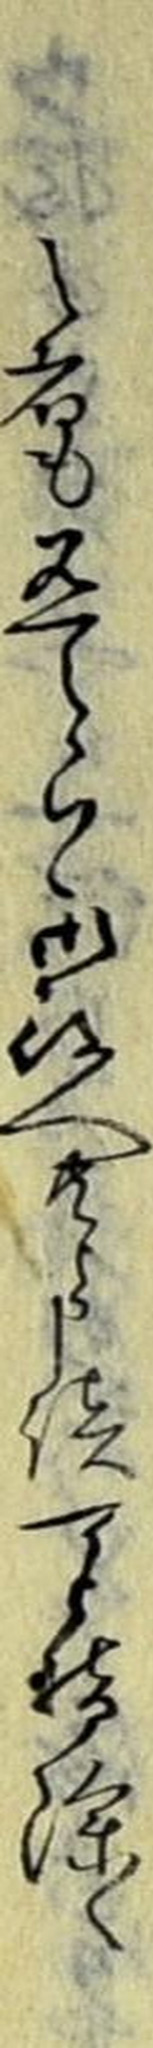之者も有之候はゝ御役人共被申談可被指除候
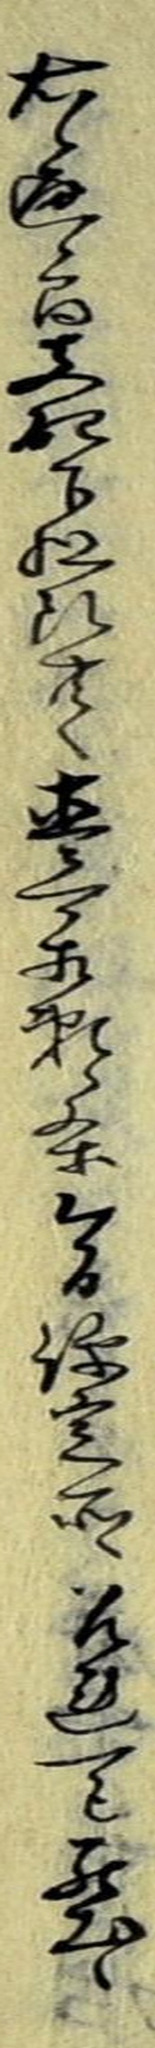右之通候間支配下組頭共へ直に可相頼候条今日評定所へ召連可被罷出候

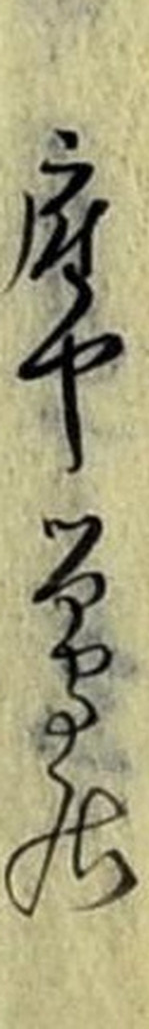府中留守居
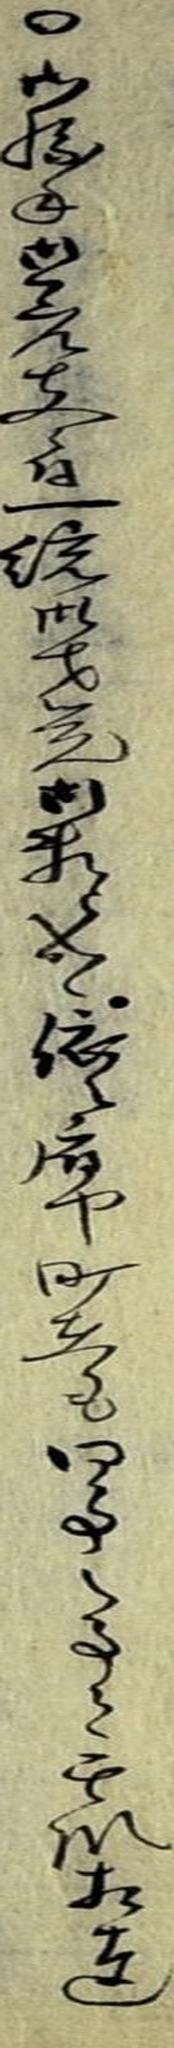〇御勝手御差支に付一統御才覚御頼被成候依之府中町在へも同事之事に候其段相達
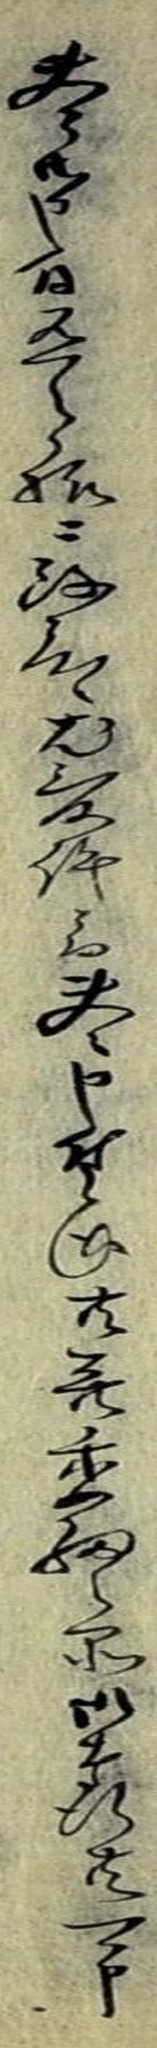夫々御申付有之候様に致度候尤爰許に而夫々申付候趣共并委細之品御奉行共可申
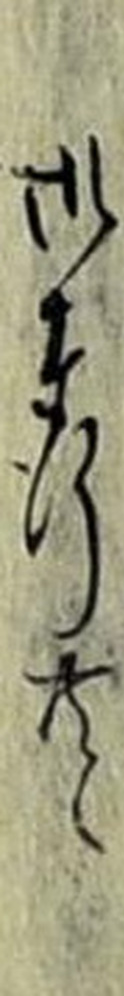御奉行共へ
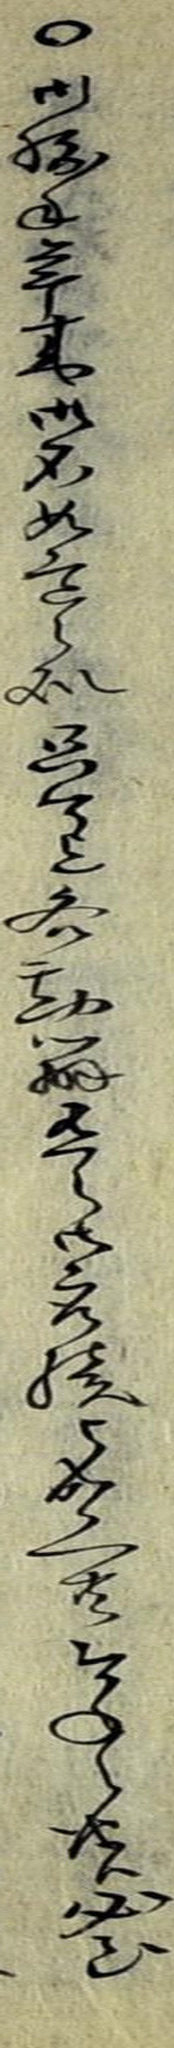〇御勝手年来御不如意之処只今迄各勘弁有之御取続被成候へ共今年之儀は必至
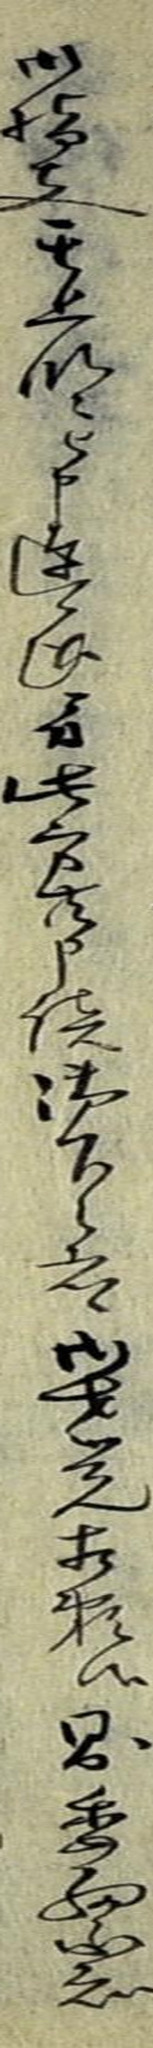御指支其上段々被申達候趣に付此方共申談御下之者へ御才覚相頼候則委細承知
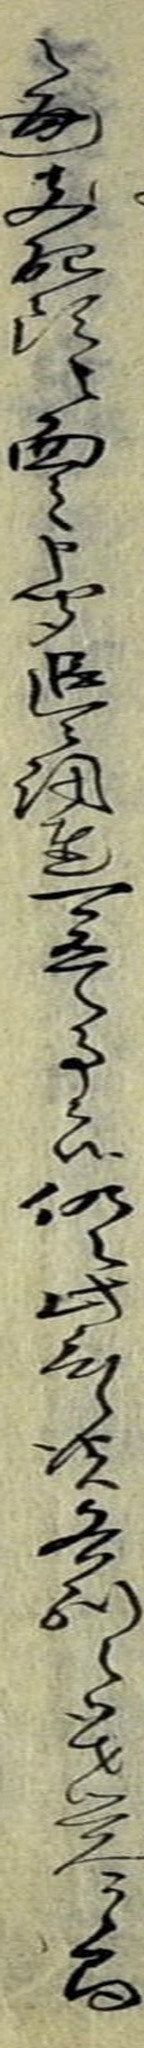之通支配頭之面々へ申聞追々調達可有之事に候仍之此度之儀は各別之御才覚に候間
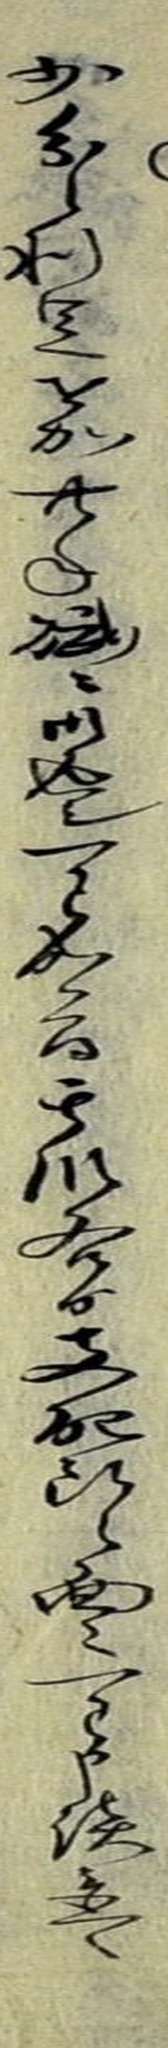少分之利足を加廿年賦に御返し可被成候間其段各ゟ支配頭之面々可被申談置候
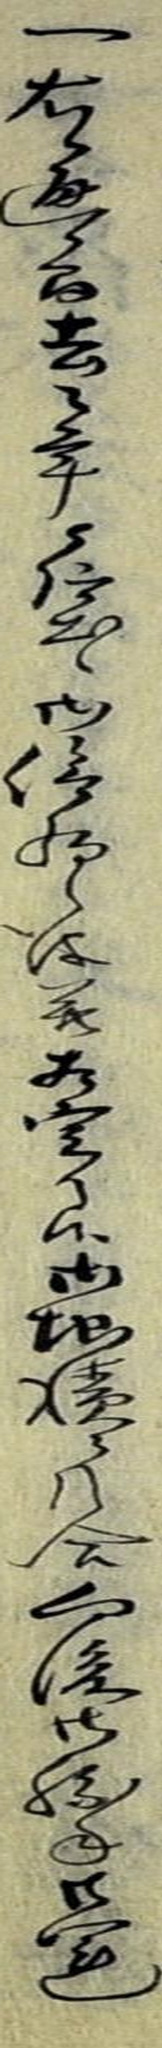一右之通候間去々年被仰出候御倹約之儀并相定り候御地積に引合向後御勝手御運
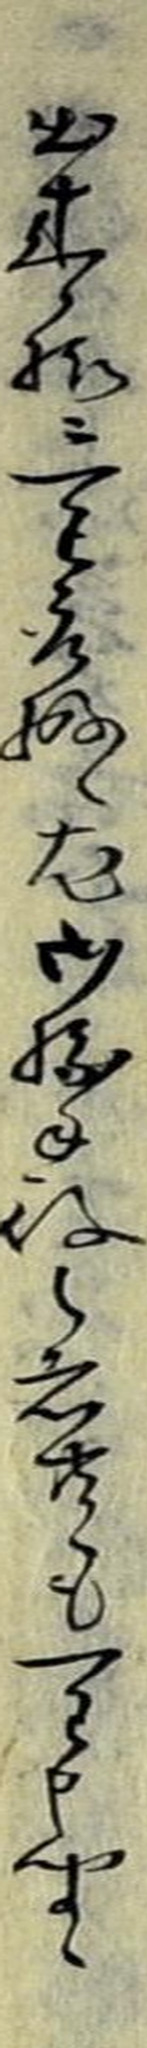出来候様に可被取扱候尤御勝手役之者共へも可被申聞候
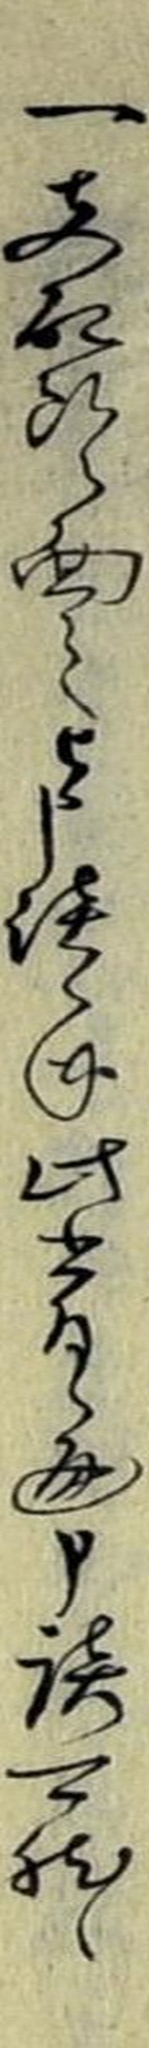一支配頭之面々へ被申談候趣此書付之通申談可然候
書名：命令之部 二
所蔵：福井県文書館 Fukui Prefectural Archives
